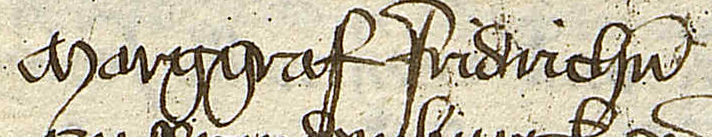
Marggraf Fridrich*n
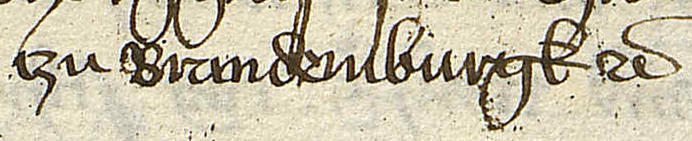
cʒu Brandemburgk ec*
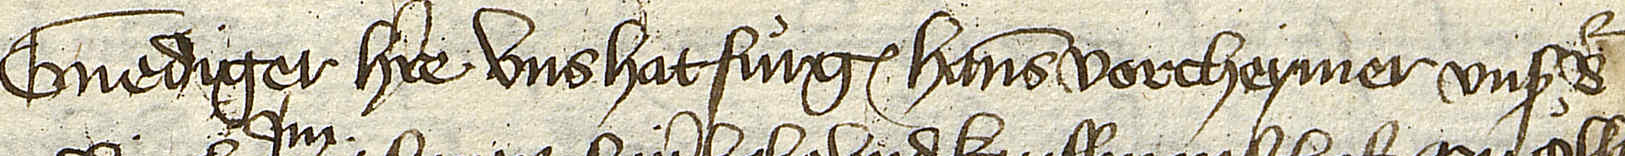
Gnediger h*re . Vns hat fürg* hans* vorcheymer vnſ* B
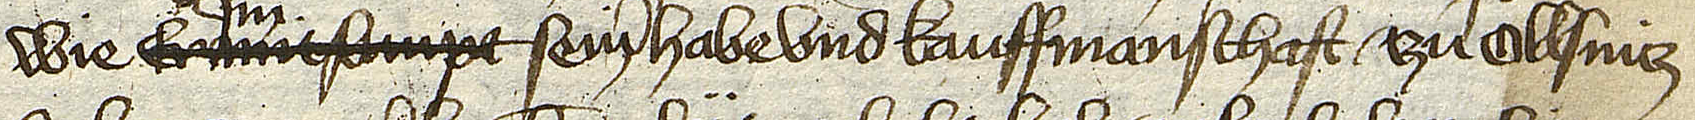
wie Er mitſampt ſein* habe vnd kauffmanſchaft / cʒu Öllſnicʒ
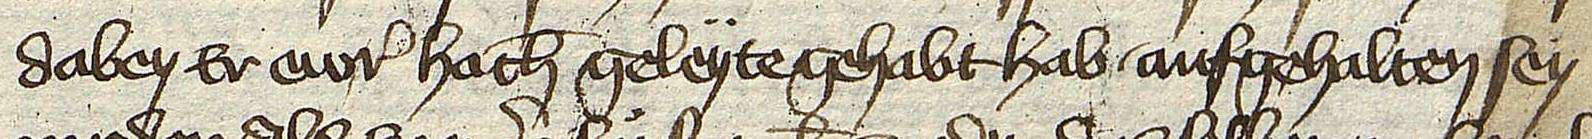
dabey Er ew*r hoch* geleyte gehabt hab / aufgehalten ſey
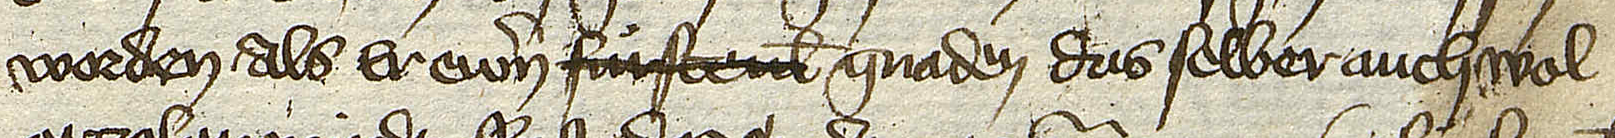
worden / Als Er ew*n fürſtenl* gnaden das ſelber auch wol
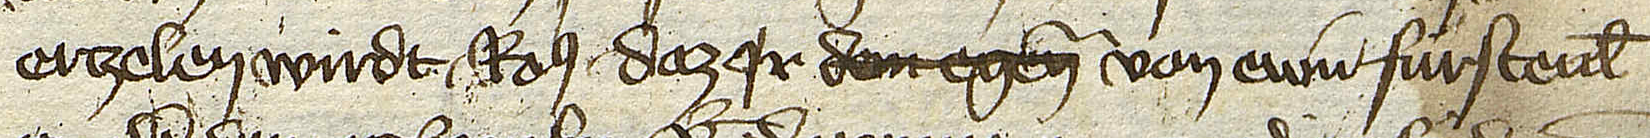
ercʒelen wirdt / Ro* / daʒ Ir dem egen* von ew*n fürſtenl*
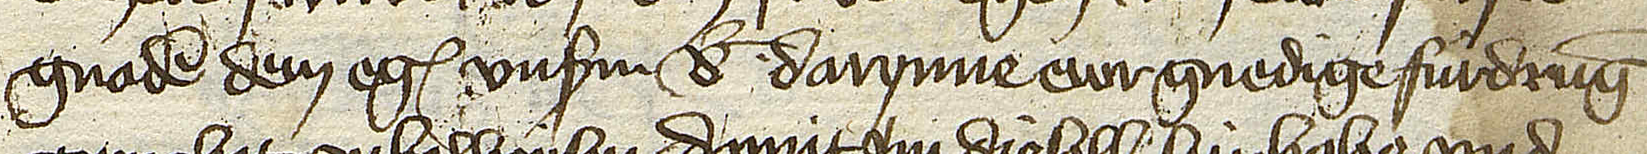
gnad* dem eg* vnſ*m B* darynne ewr gnedige fürdru*g
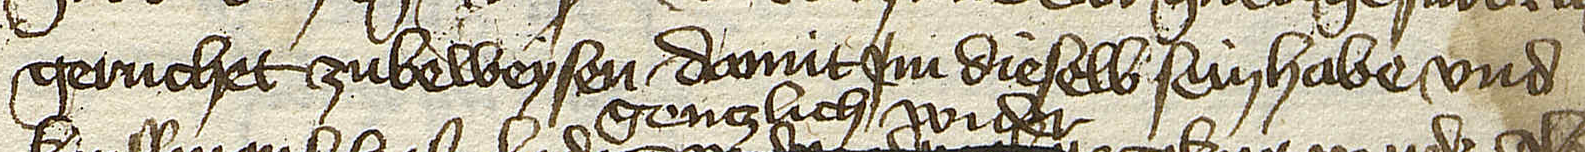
geruchet cʒubeweyſen / damit Im dieſelb ſein habe vnd
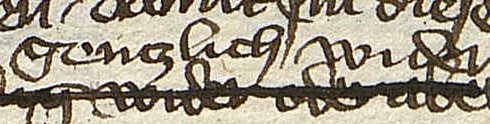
gencʒlich wider
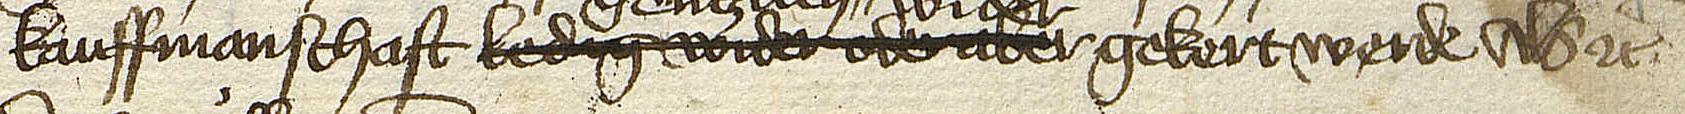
kauffmanſchaft ledig wider oder aber gekert werde Als ec*
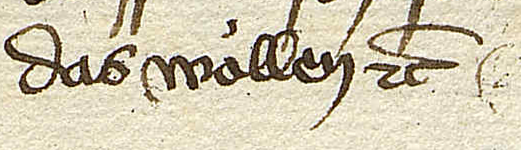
das wöllen ec* /
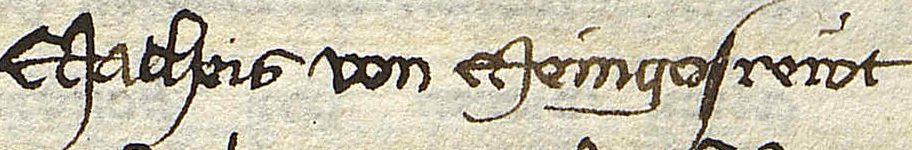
Matheis von Meingoſrewt
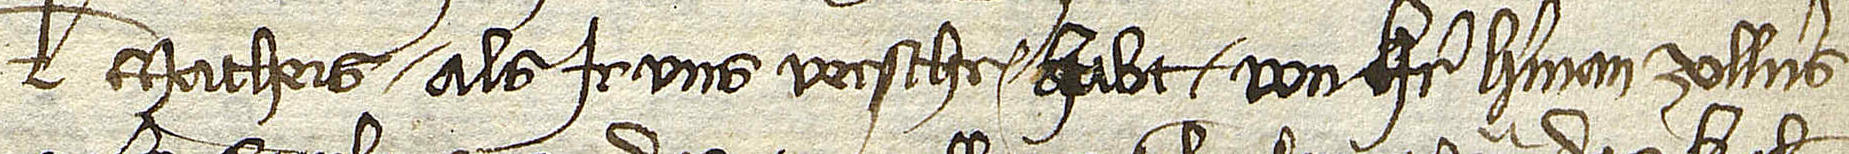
L* Matheis / als Ir vns verſchr* habt / von h*r h*man ʒolln*s
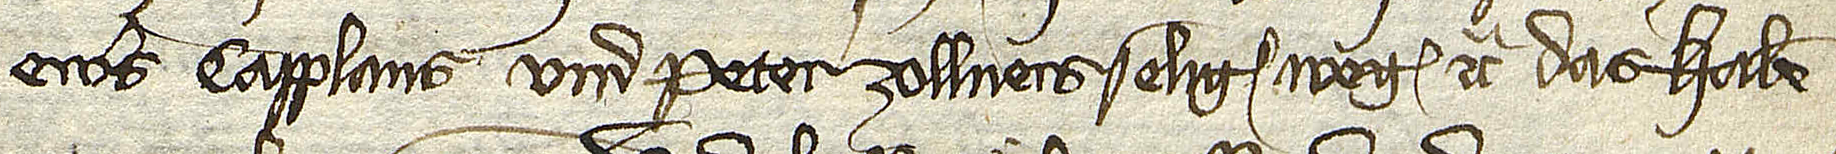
ew*s Capplans vnd Peter ʒollners ſelig* weg* ec* das habe*
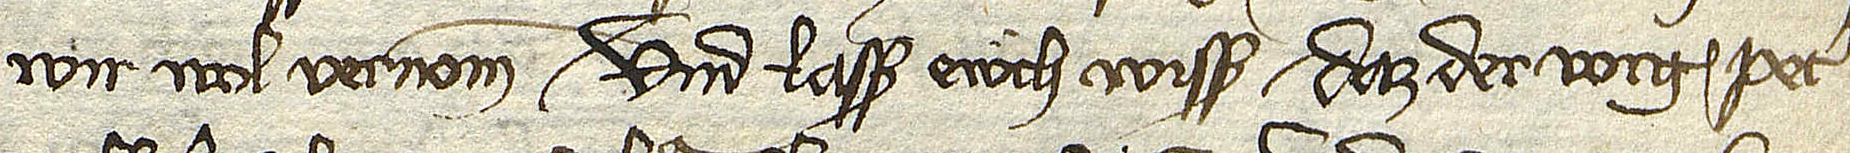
wir wol vernom* / Vnd laſſ* ewch wiſſ* / daʒ der vorg* pet*
